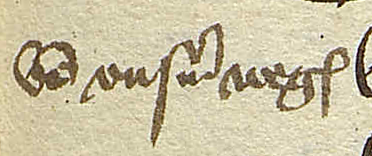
vo* vnſn* weg*
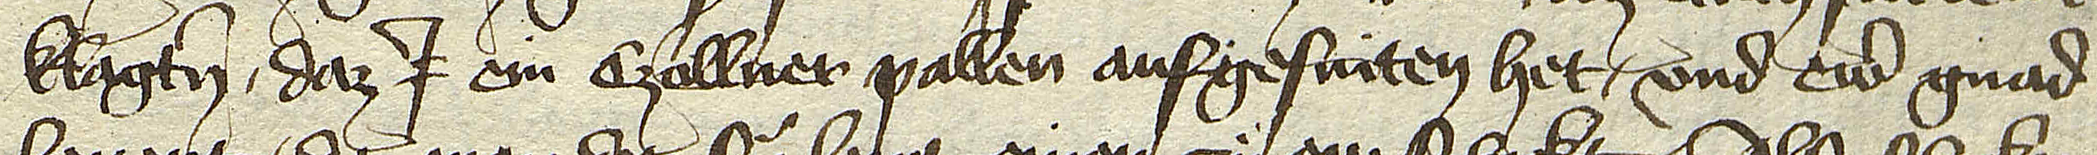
klagtn* / daʒ I ein Cʒollner pallen auſgeſniten het / vnd ew* gnad
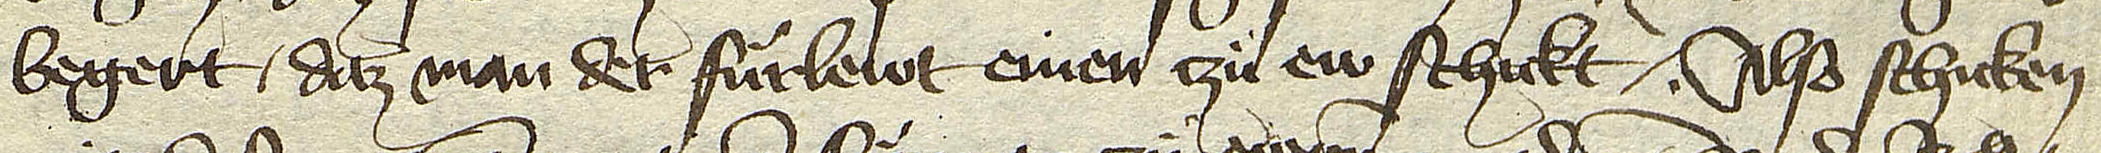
begert / daʒ man der fürlewt einen cʒü ew ſchickt / . Alſo ſchicken
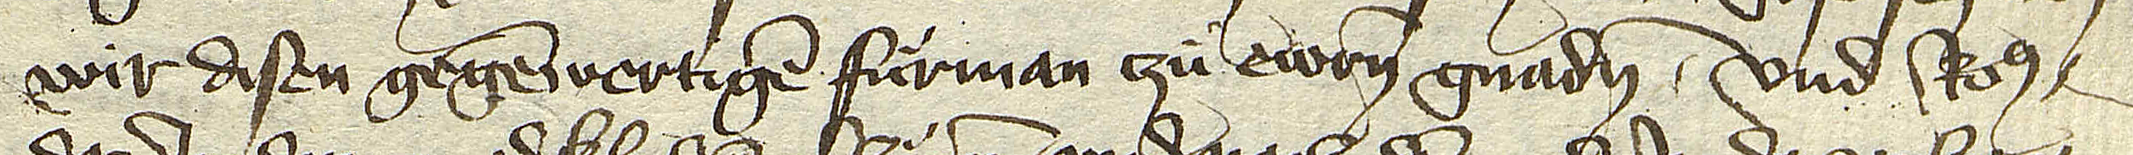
wir diſen gege*wertige* fürman cʒü ewrn* gnadn* / vnd Ro* /
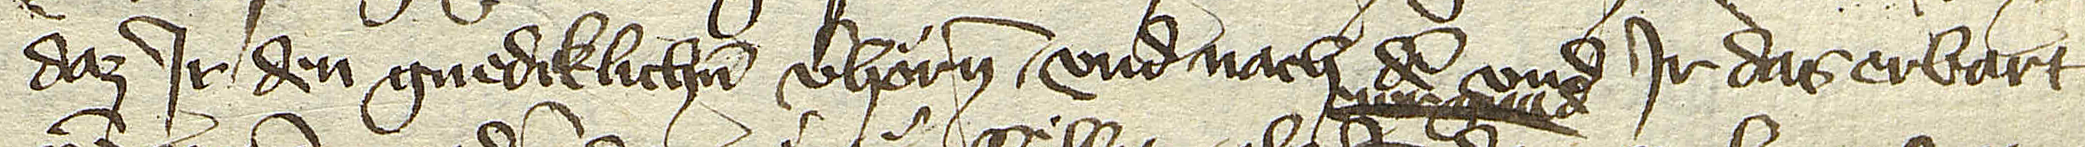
daʒ Ir den gnediklichn* v*hörn* / vnd nach d* vnd Ir das ervart
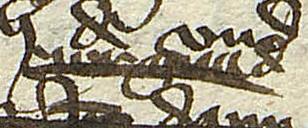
ewre gnad
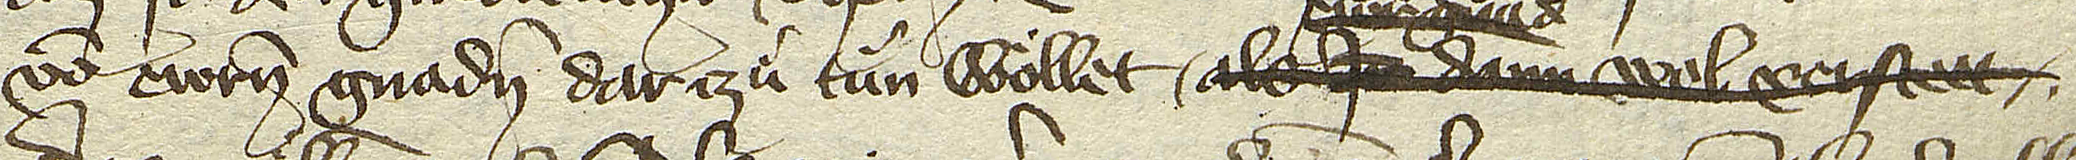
vo* ewrn* gnadn* darcʒü tün wöllet / als Ir dann wol verſteet / .
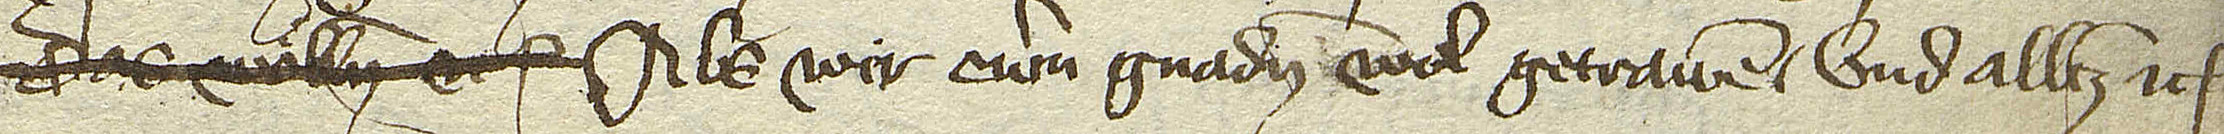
Das wölln* ec* Als wir ew*n gnadn* wol getrawe* / vnd allcʒ* ec*
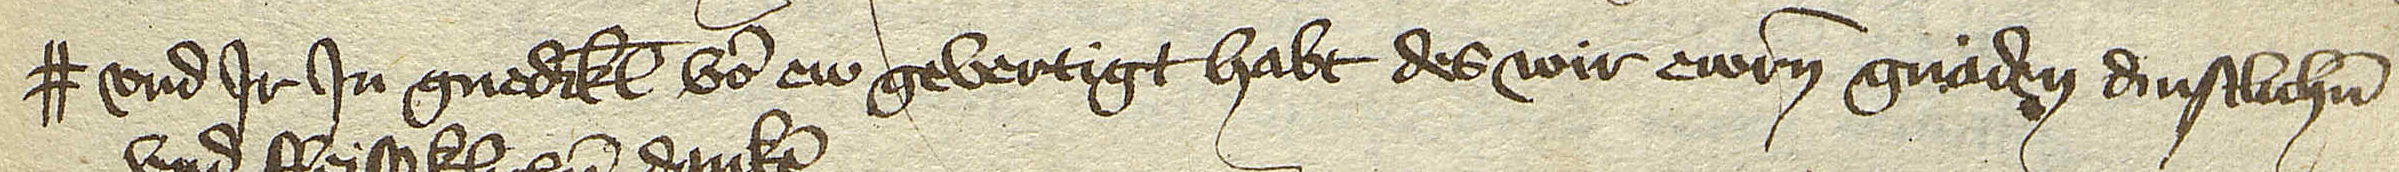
vnd Ir In gnedikl* vo* ew gevertigt habt des wir ewrn* gnaden dinſtlichn*
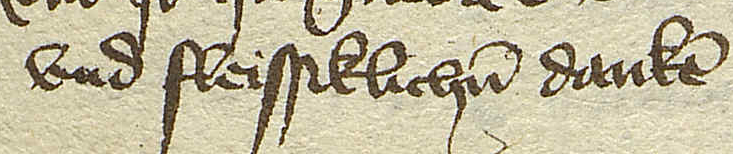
vnd fleiſſiklichn* danke*
